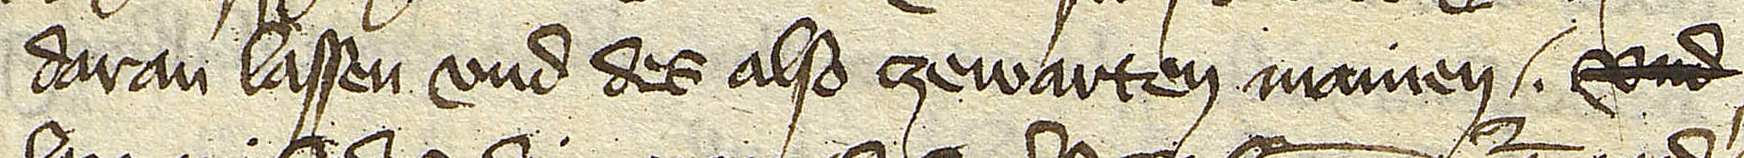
daran laſſen vnd des alſo cʒewarten mainen / . vnd
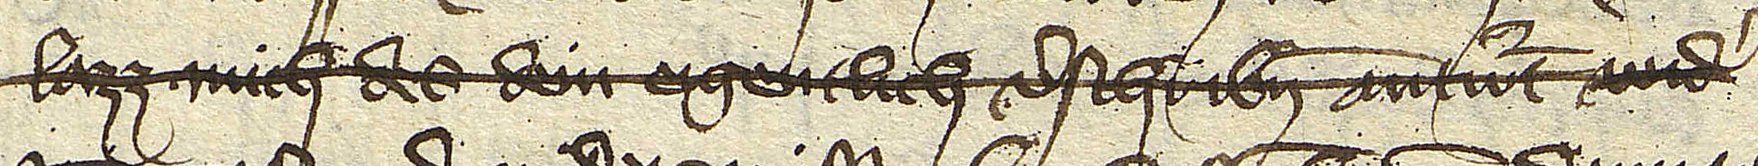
laʒʒ mich des dein eigentlich v*ſchribn* antwt* wid*
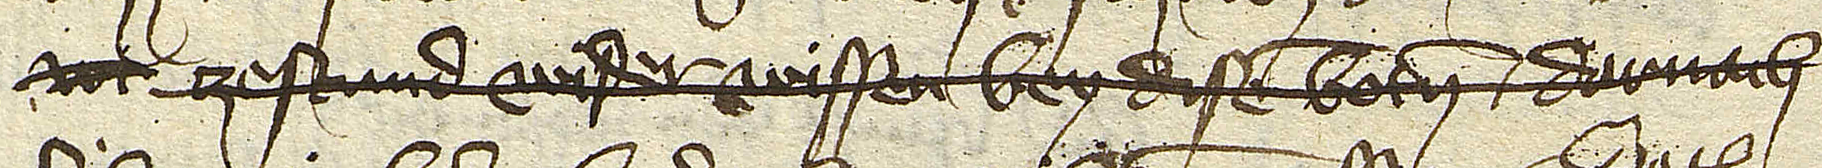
wi cʒeſtund wider wiſſen bey diſe* botn* / darnach
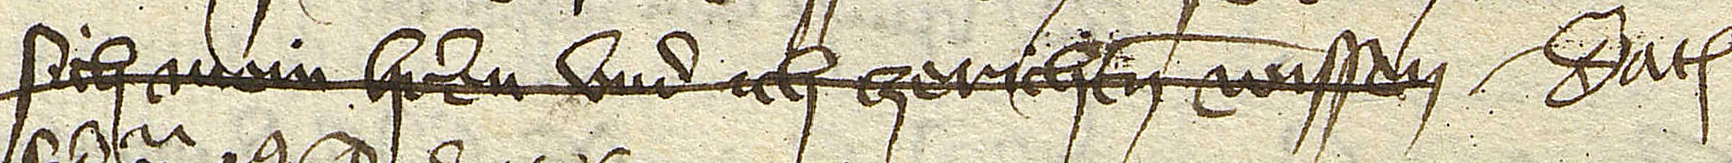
ſich mein hr*en vnd ich cʒerichtn* wiſſen / Dat*
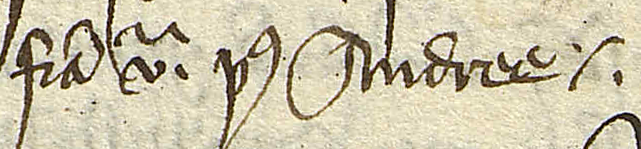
fia* v* . p* Andree / .
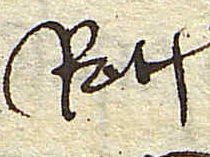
Rot*
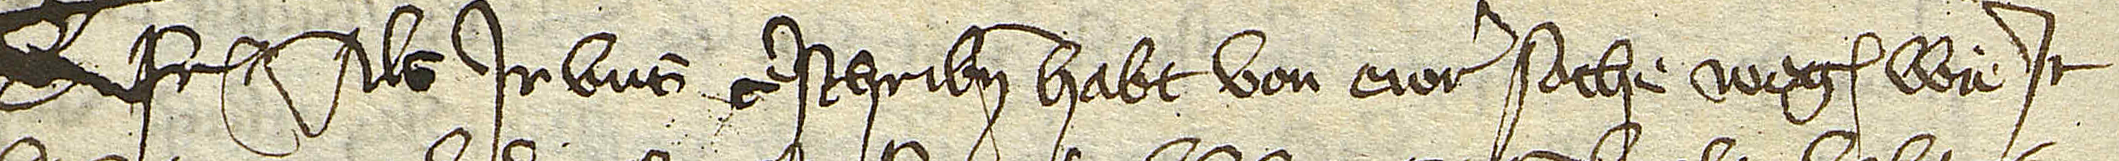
L* fr* / Als Ir vns v*ſchribn* habt von ewr* ſache weg* wie Ir
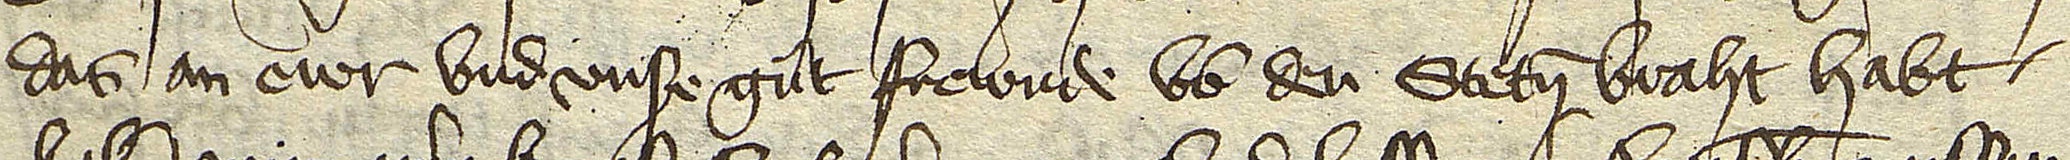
das an ewr vnd vnſ*e güt frewnde vo* den Stetn* braht habt /
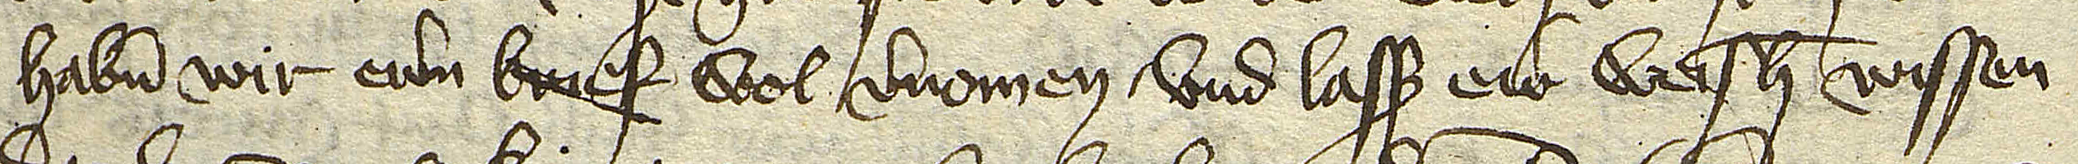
habn* wir ewn* brief wol v*nomen / vnd laſſ* ew* weiſh* wiſſen
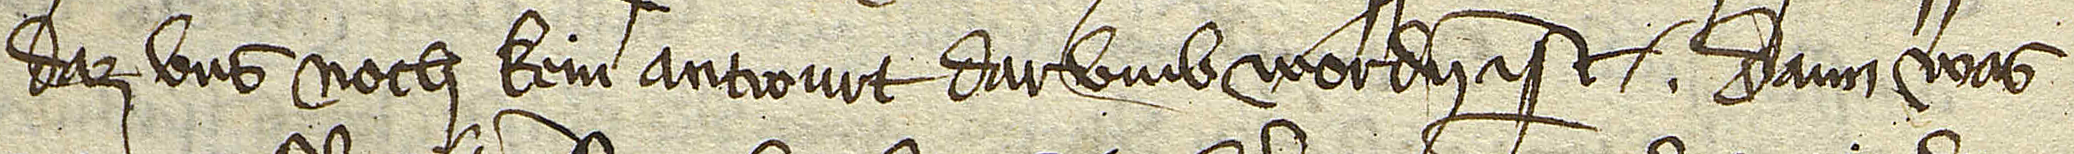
daʒ vns noch kein antwurt darvmb wordn* iſt / . Dann was
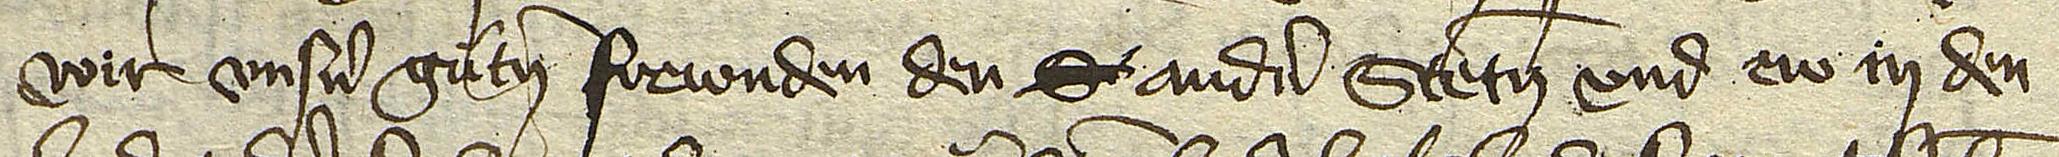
wir vnſn* gutn* frewnden den S andn* Stetn* vnd ew in den
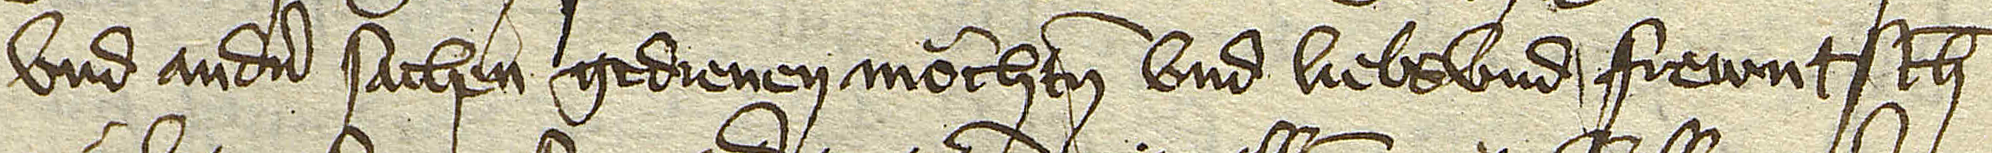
vnd andn* ſachen gedienen möchtn* vnd liebs vnd frewntſch*
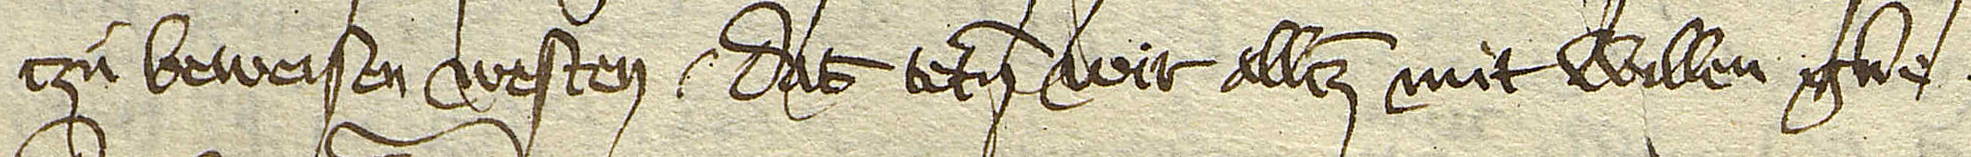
cʒü beweiſen weſten / das tetn* wir allcʒ* mit willen gn*e
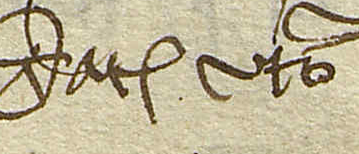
Dat* vts*
